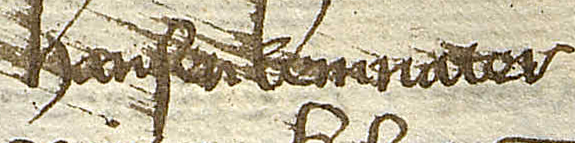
Hanſen Kemnater
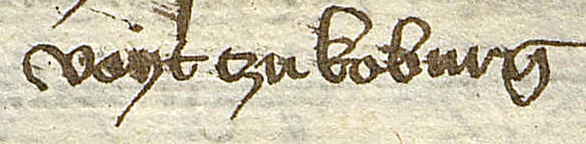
voyt cʒu koburg
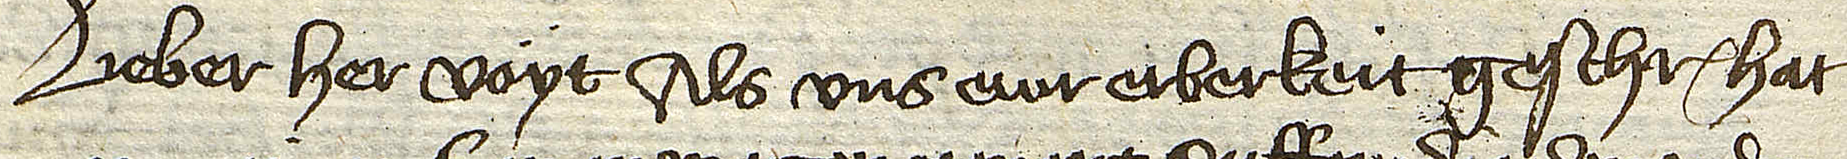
Lieber her voyt Als vns ewr erberkeit geſchr* hat
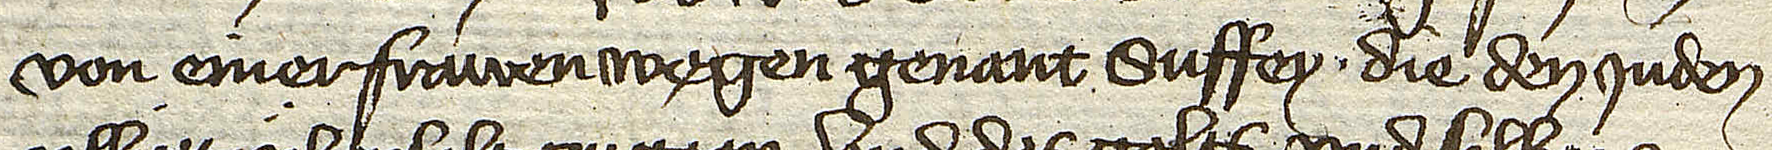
von einer frawen wegen genant Suffey . die den Iuden
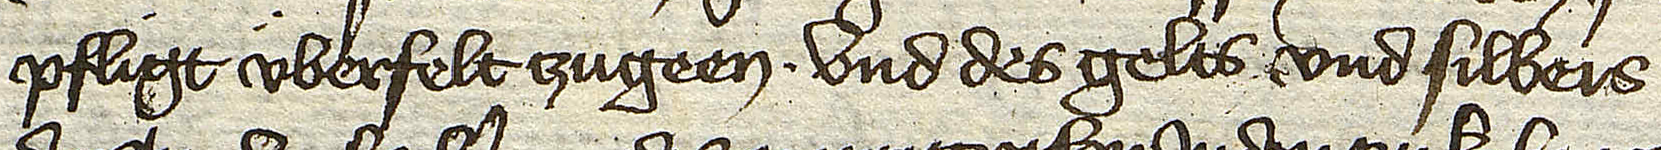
pfligt v̈berfelt cʒugeen . vnd des gelts . vnd ſilbers
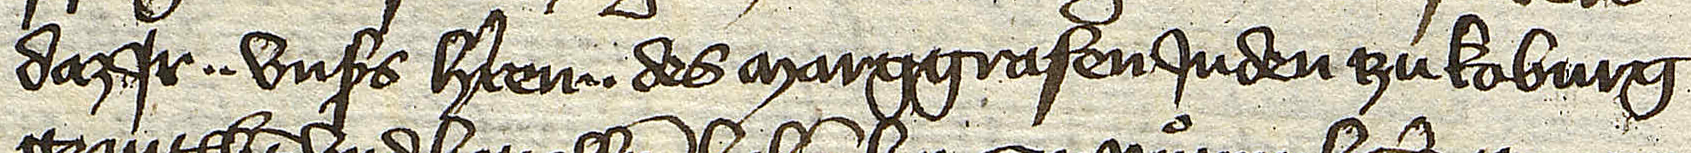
daʒ Ir ~ vnſ*s h*ren ~ des Marggrafen Iuden cʒu koburg
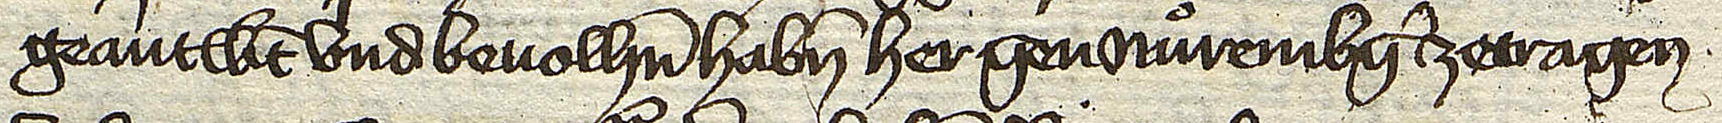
geantw*t vnd beuolh*n hab*n her gen Nürembg* cʒetragen
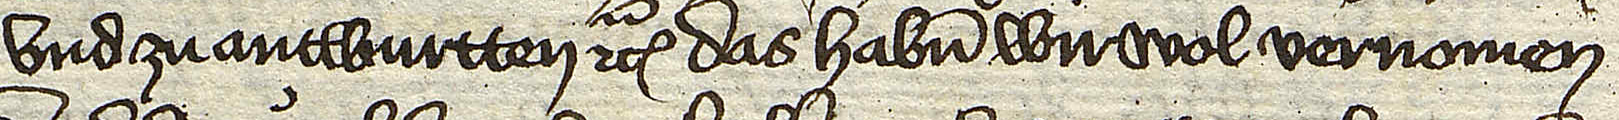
vnd cʒu antwurtten ec* das hab*n wir wol vernomen
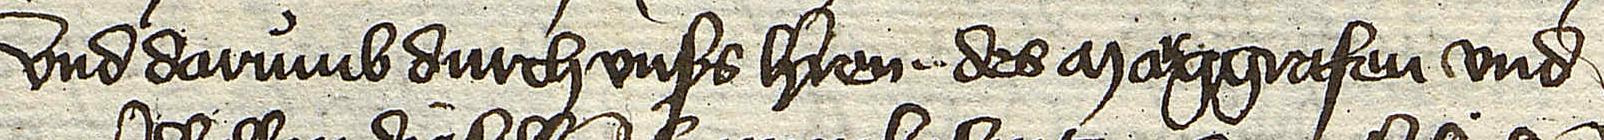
Vnd darümb durch vnſ*s h*ren ~ des Marggrafen vnd
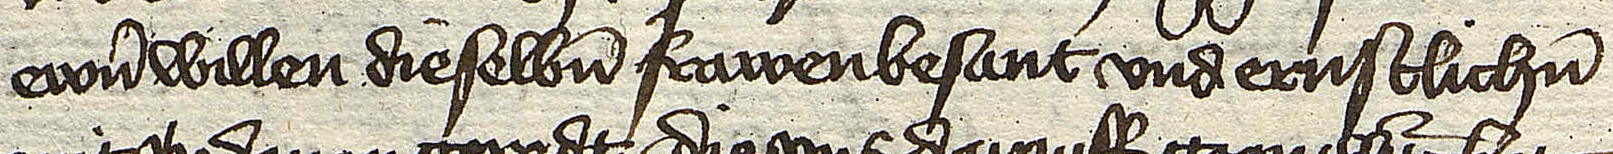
ew*n willen dieſelb*n frawen beſant vnd ernſtlich*n
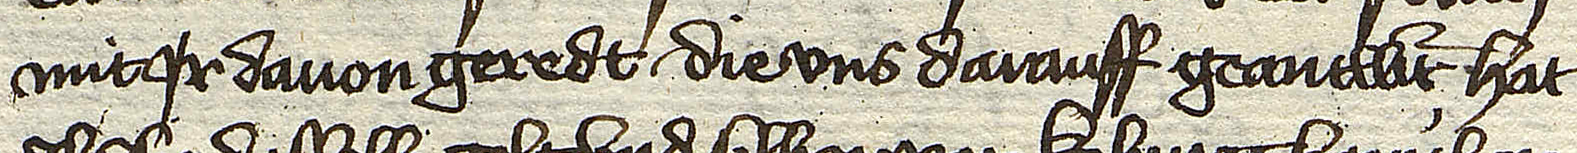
mit Ir dauon geredt / die vns darauff geantw*t hat
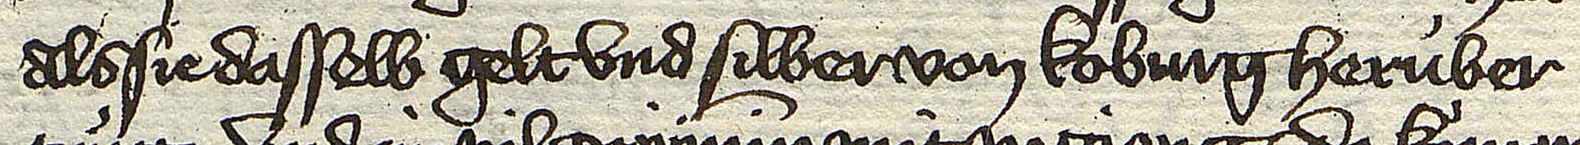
Als ſie daſſelb gelt vnd ſilber von koburg herüber
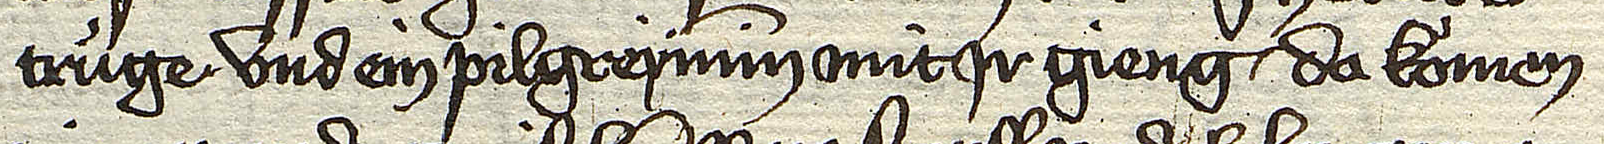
trüge . Vnd ein pilgreymin* mit Ir gieng / da kömen
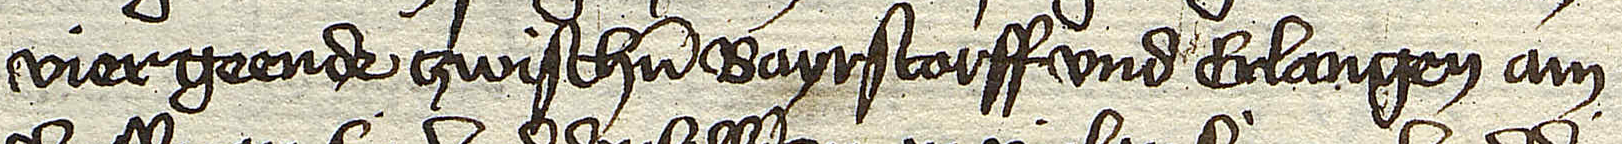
vier geende cʒwiſch*n Bayrſtorff vnd Erlangen am
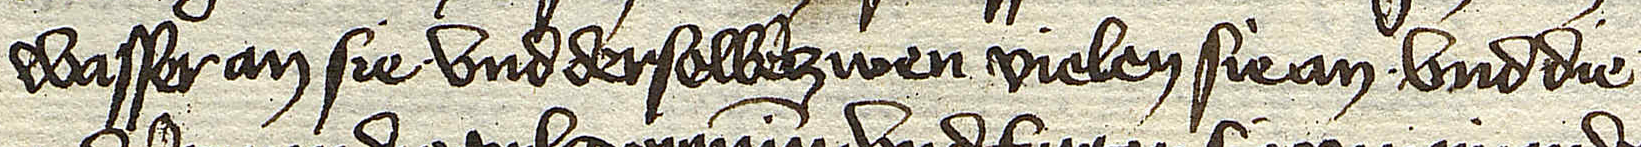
waſſer an ſie . vnd derſelbe* ʒwen vielen ſie an . vnd die
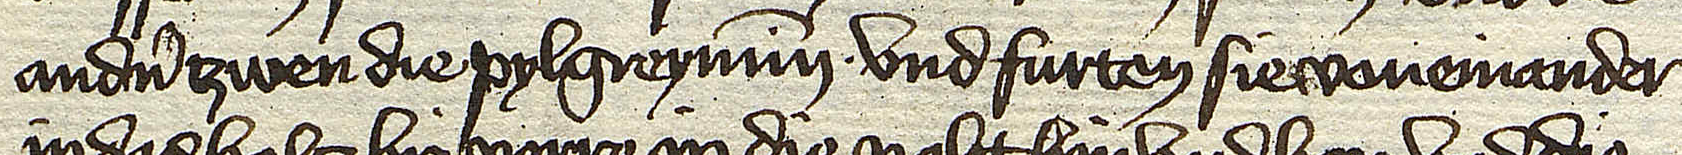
and*n cʒwen die pylgreymin* . vnd furten ſie voneinander
